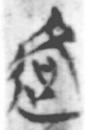○（路）
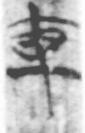車
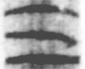三
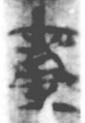𨍱（乘）
